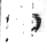於
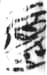○（復）
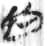於
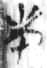未
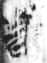○（怨）
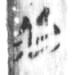於
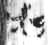申
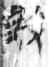○（媚）
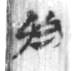於
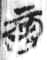梄（酉）
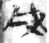凡
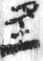坐
